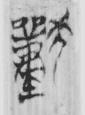獸
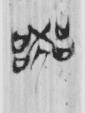器
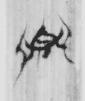卿
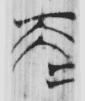夫
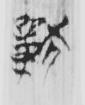獸
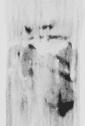正
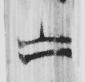士
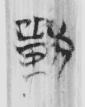獸
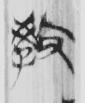教
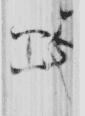攻
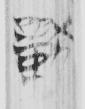獸
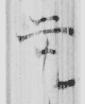丂
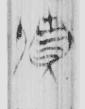價
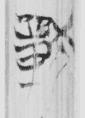獸
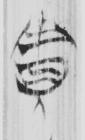賈
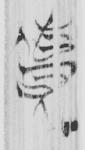{人𡴎貝}
